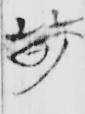苛
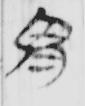胃（謂）
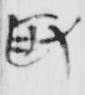取（娶）
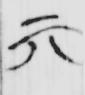亓（其）
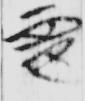妾
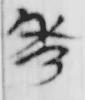秀
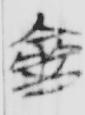齊
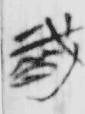戠
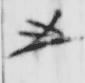之
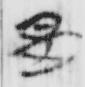是
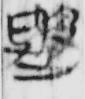○（舉）
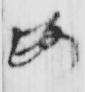爲
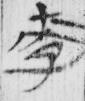李
